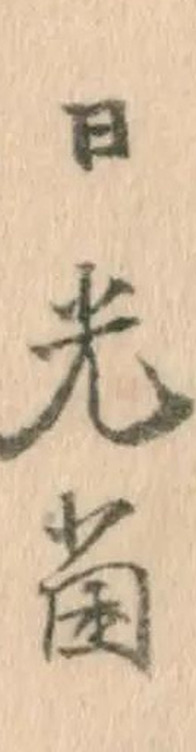日光菌
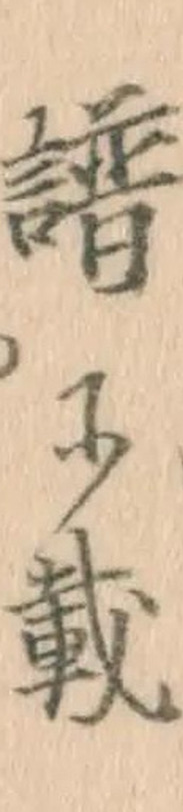譜に載
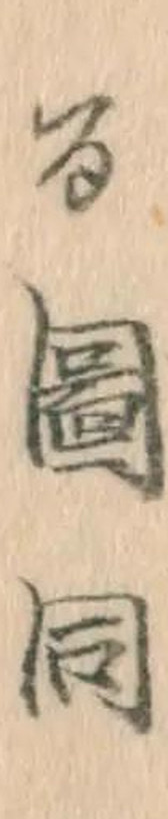る図同
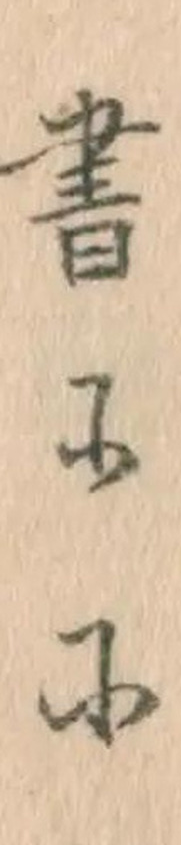書にに
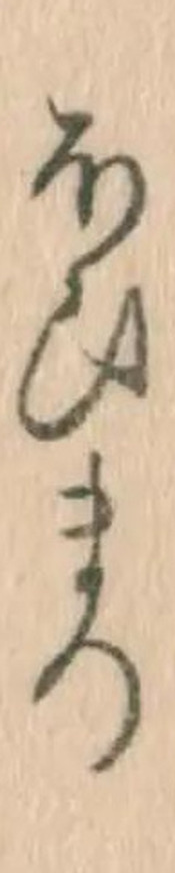ほひまつ
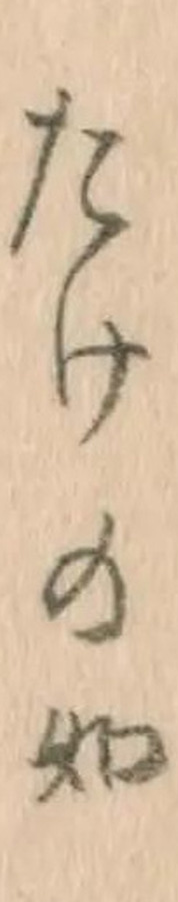たけの如
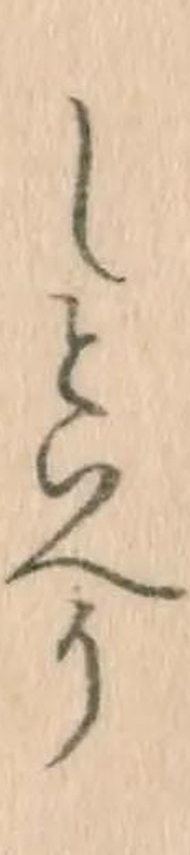しといへり
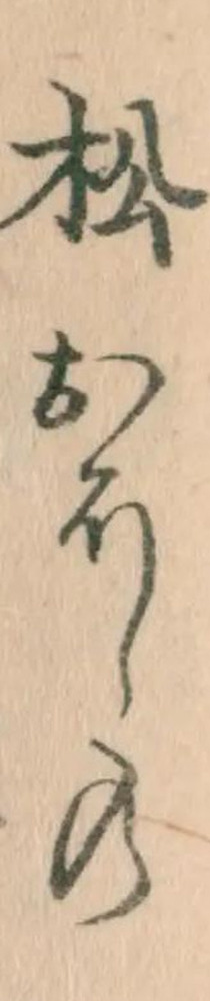松おほしの
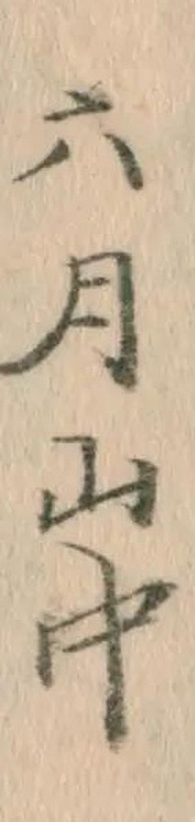六月山中

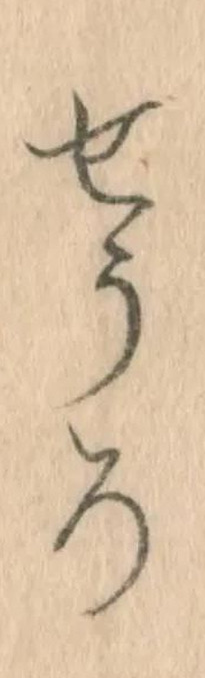せうろ
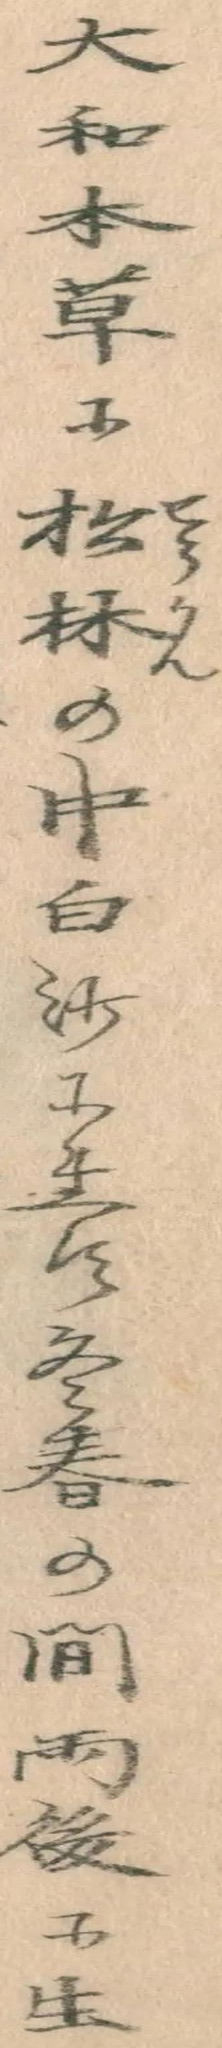大和本草に松林の中白沙に生す冬春の間雨後に生
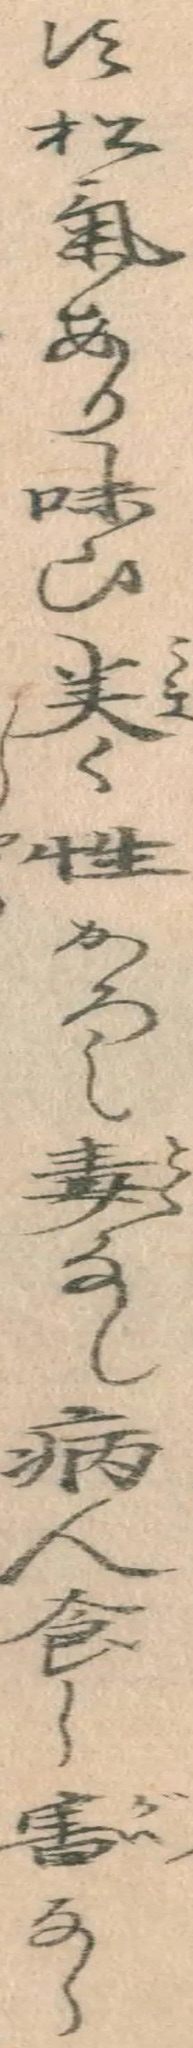す松気あり味ひく性かろし毒なし病人食し害なし
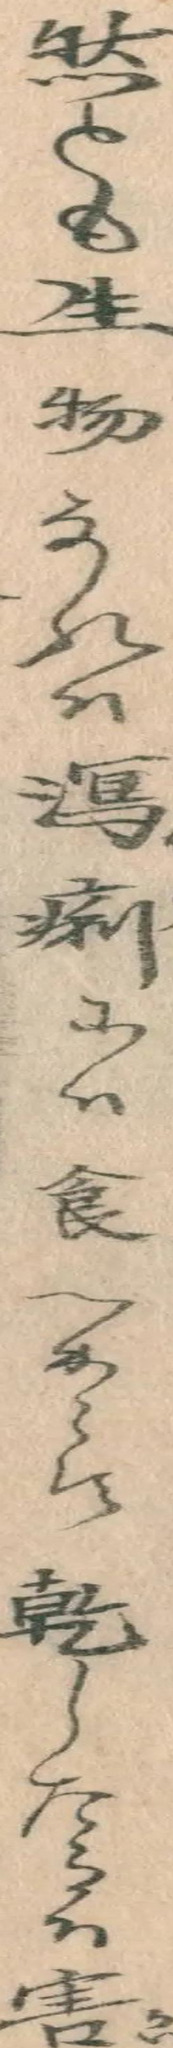然とも生物なれは瀉痢には食へからす乾したるは害
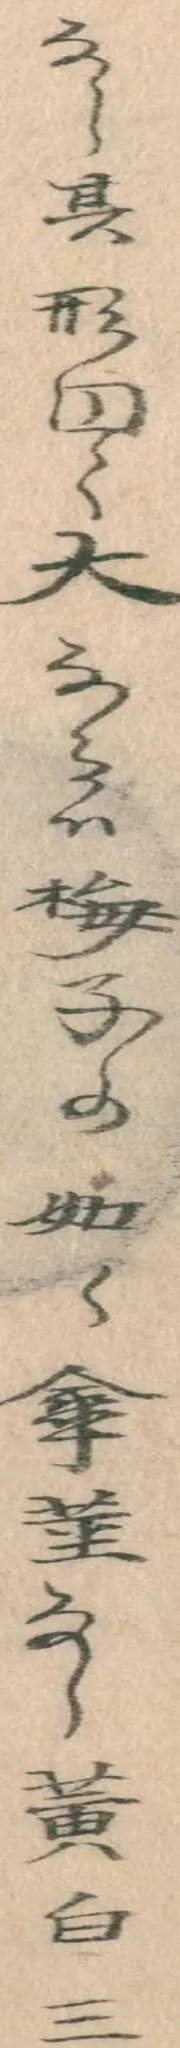なし其形円く大なるは梅子の如く傘茎なし黄白三
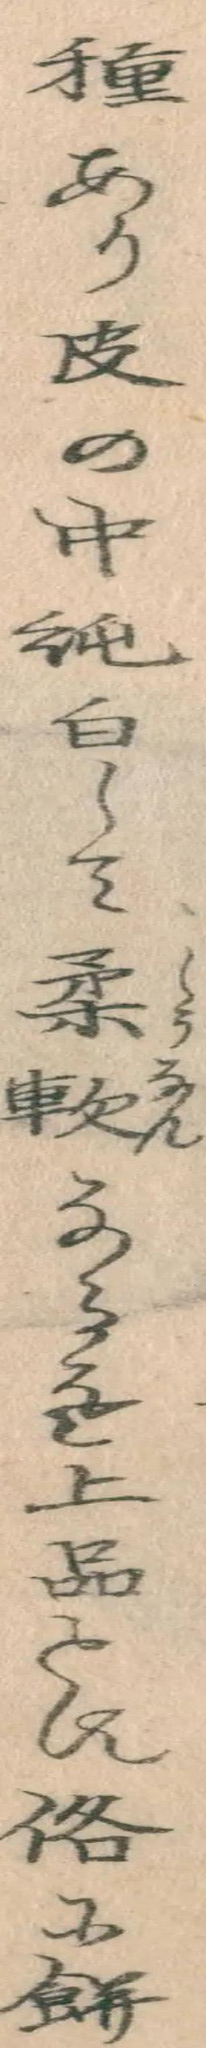種あり皮の中純白して柔軟なるを上品とす佫に餅
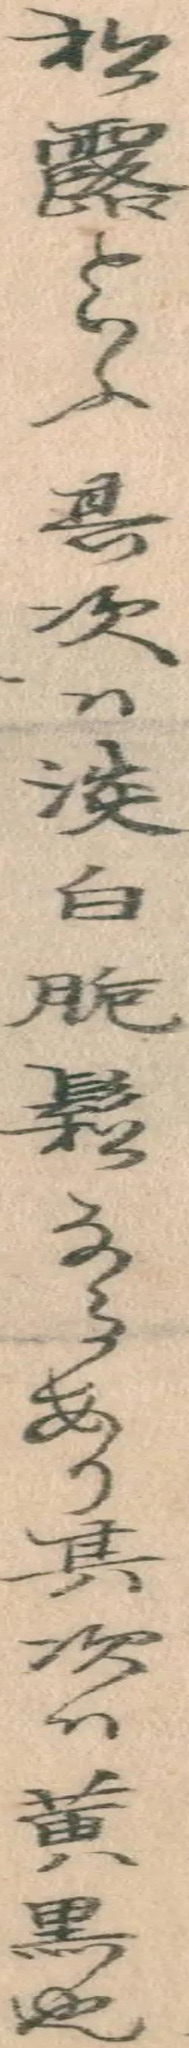松露といふ其次は淡泊脆鬆なるあり其次は黄黒地
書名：本草図譜. 巻55-57
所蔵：国立国会図書館 National Diet Library, JAPAN
